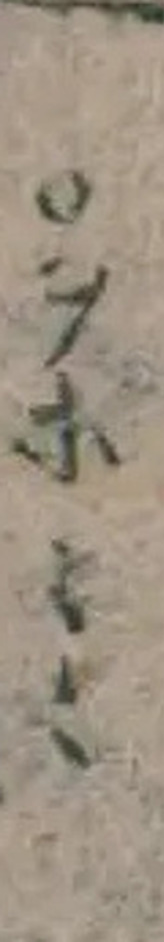○ヲホヽヽ
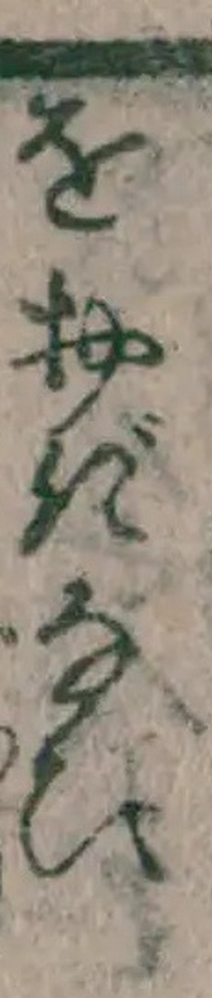をおぎなひ
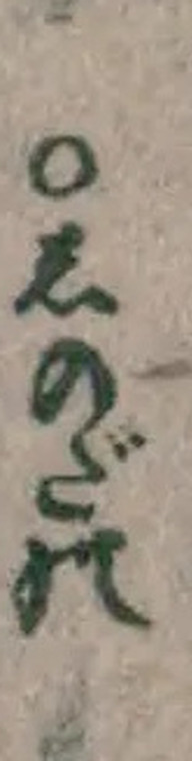○しのだの
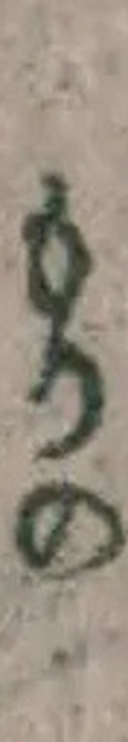もりの
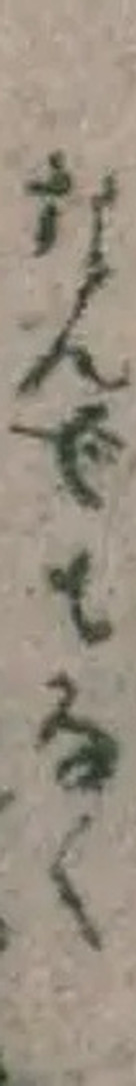なんでもなく
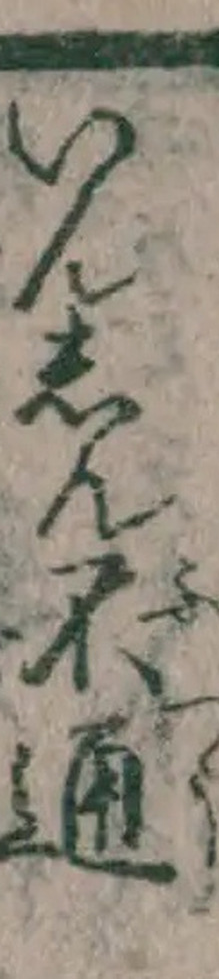いんしん不通
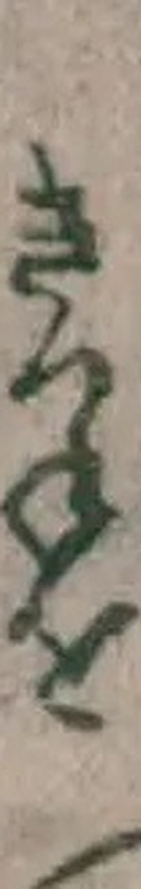きつねを
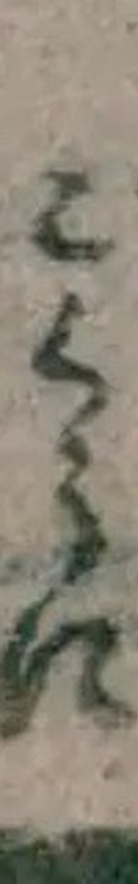こくうに
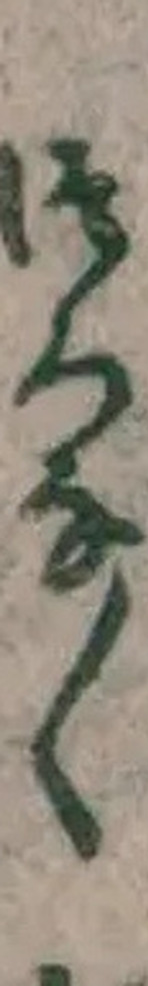つろな〳〵
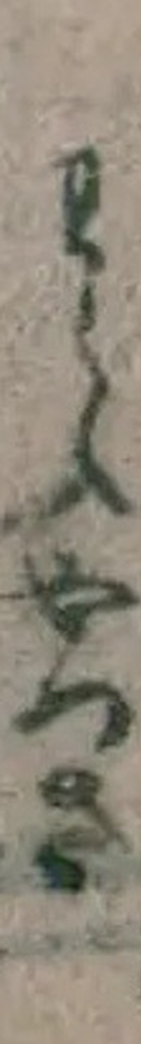わらふやつさ
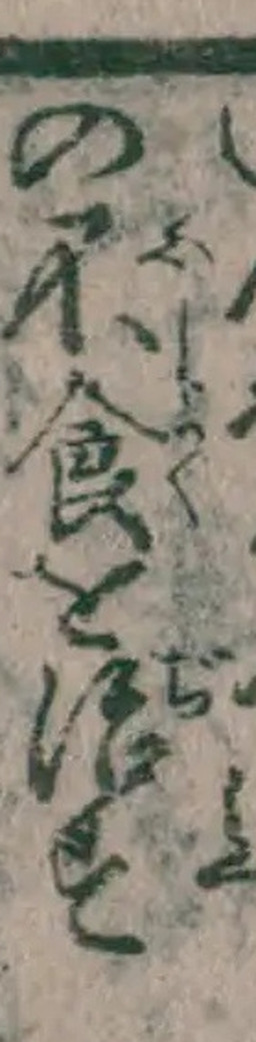の不食を治す
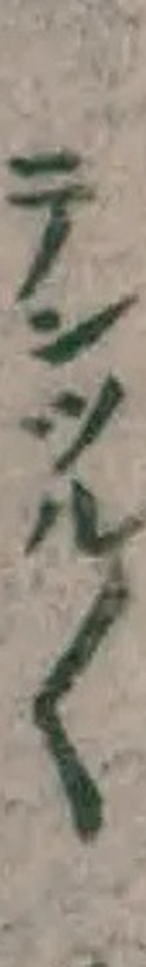テンツル〳〵
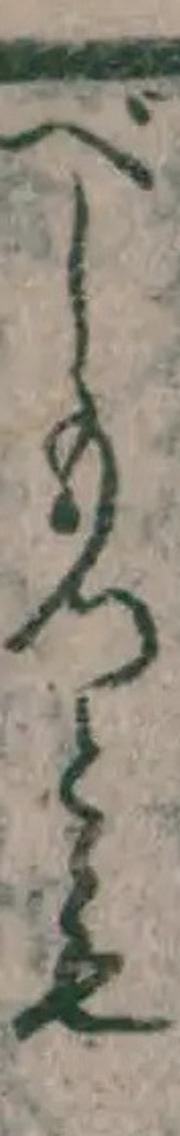べしもつとも
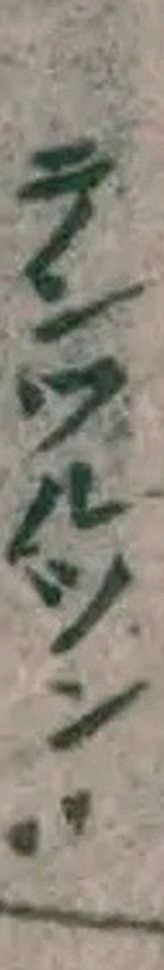テンツルツン
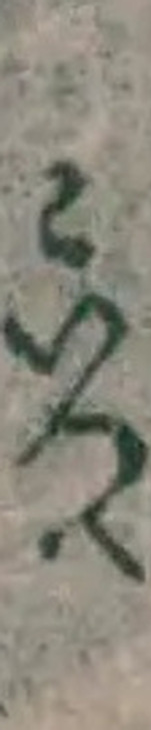こいつは
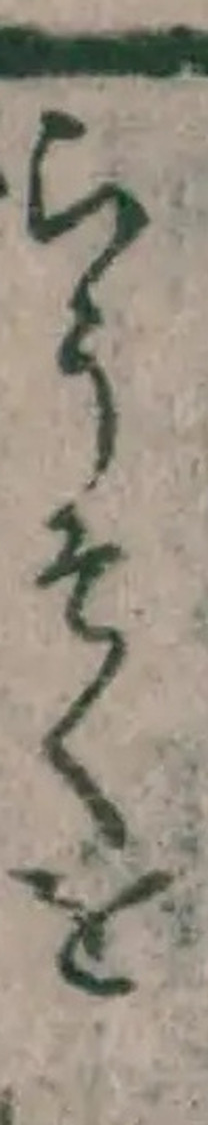らうそくを
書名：視薬霞報条 3巻
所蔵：国立国会図書館 National Diet Library, JAPAN
